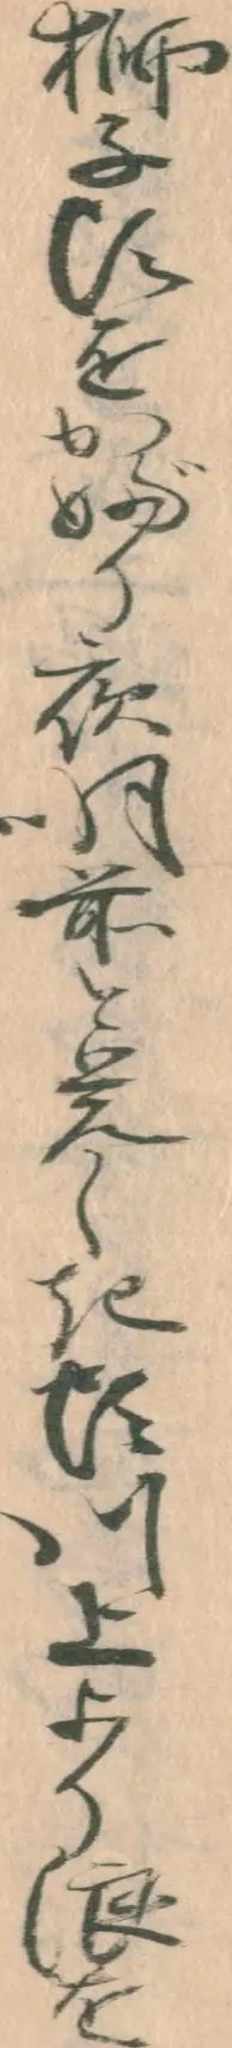獅子頭をかぶり夜明前と覚しき頃川上より浪を
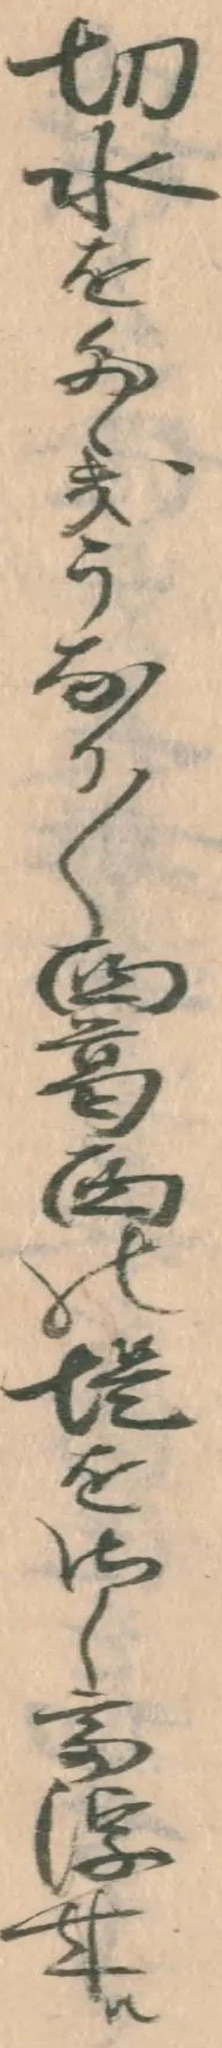切水をたゝきうなり〳〵西葛西の堤をさして浮来る
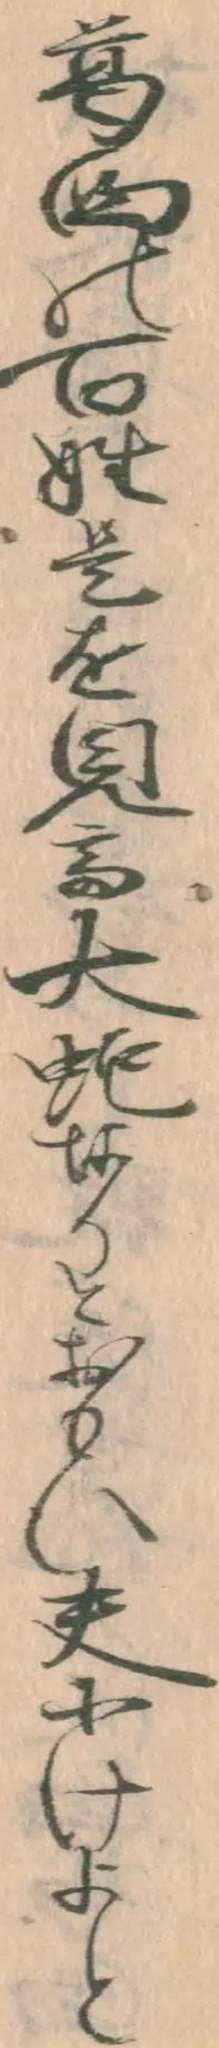葛西の百姓是を見て大蛇なりとおもひ夫にけよと
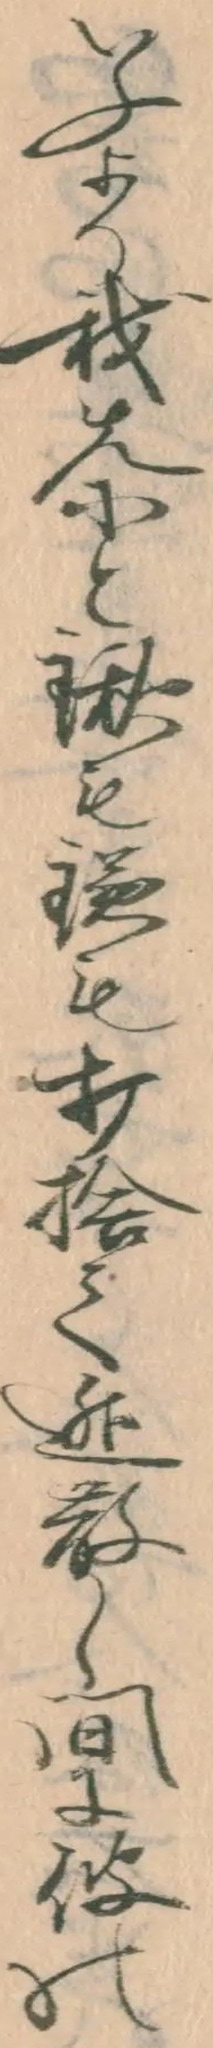いふより我先にと鍬も鎌も打捨て逃散し間に彼の
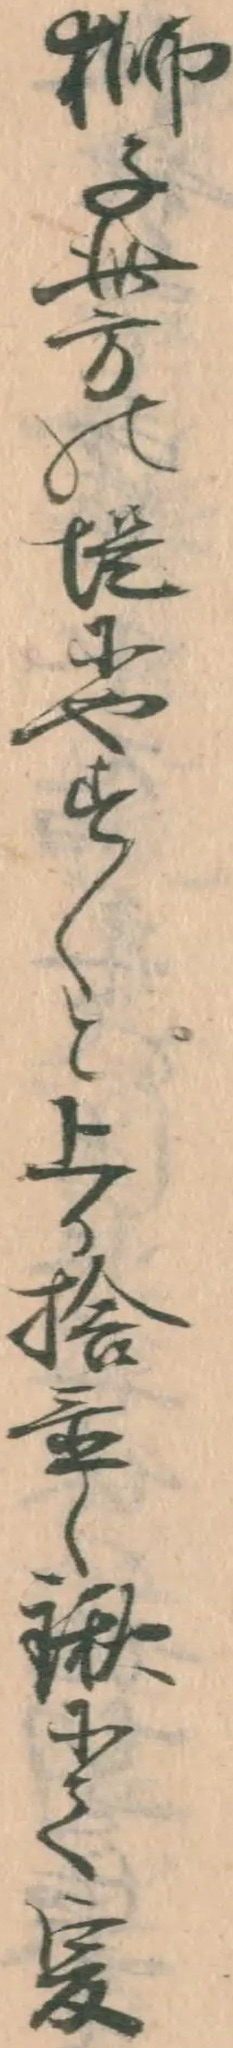獅子此方の堤にやす〳〵と上り捨置し鍬にて爰
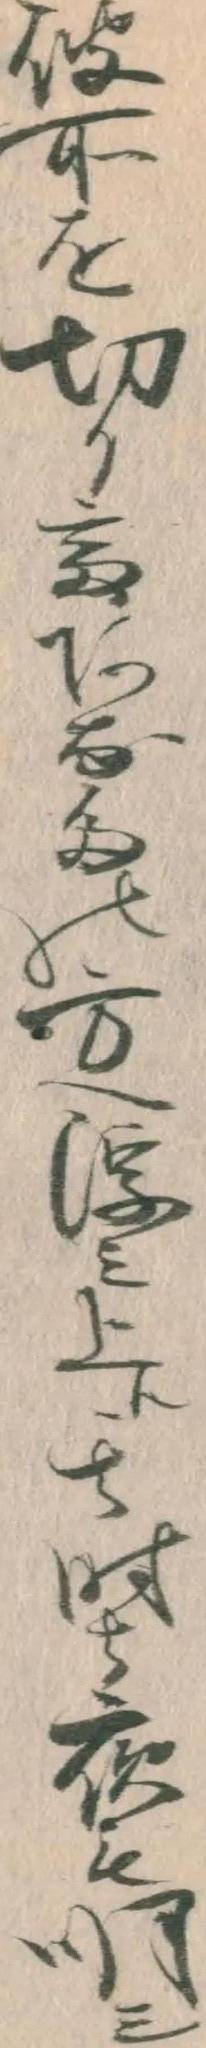彼所を切りてあなたの方へ浮み上ん候其時は夜取明し
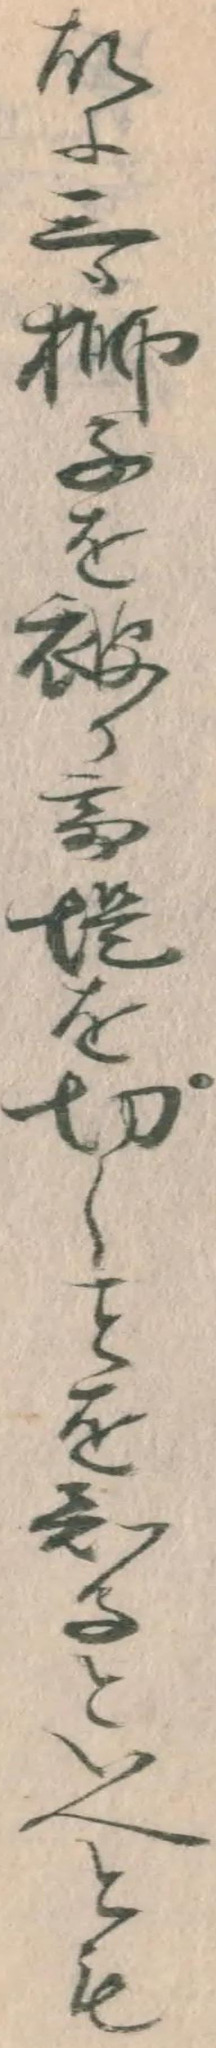故に三つ獅子を被りて堤を切しことを知るといへとも
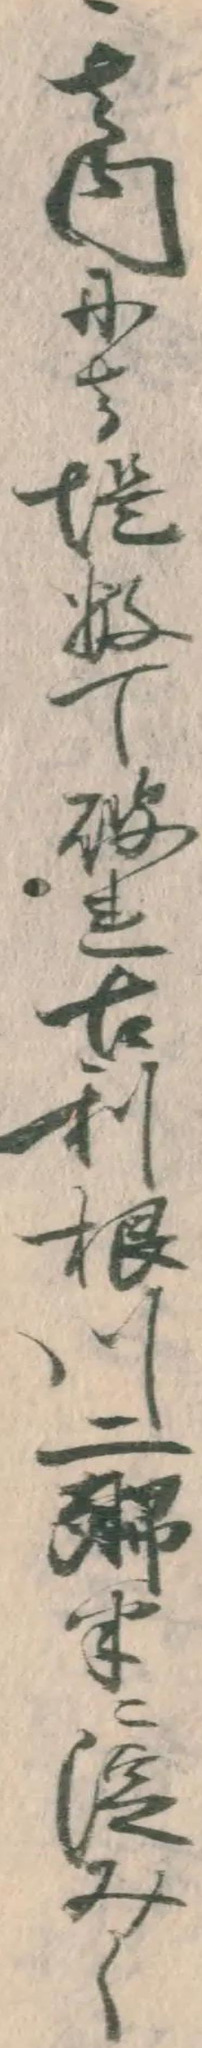其内には堤数丁破れ古利根川二郷半に淀みし
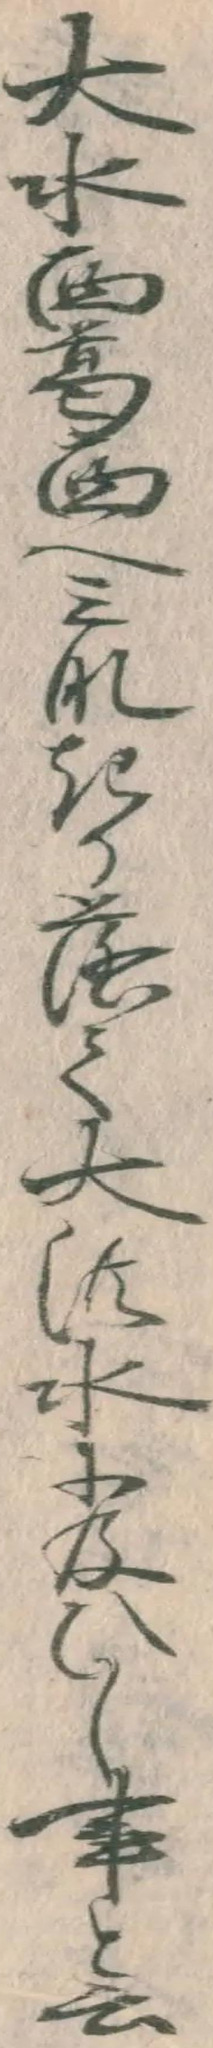大水西葛西へみなきり落て大洪水に及ひし事と云
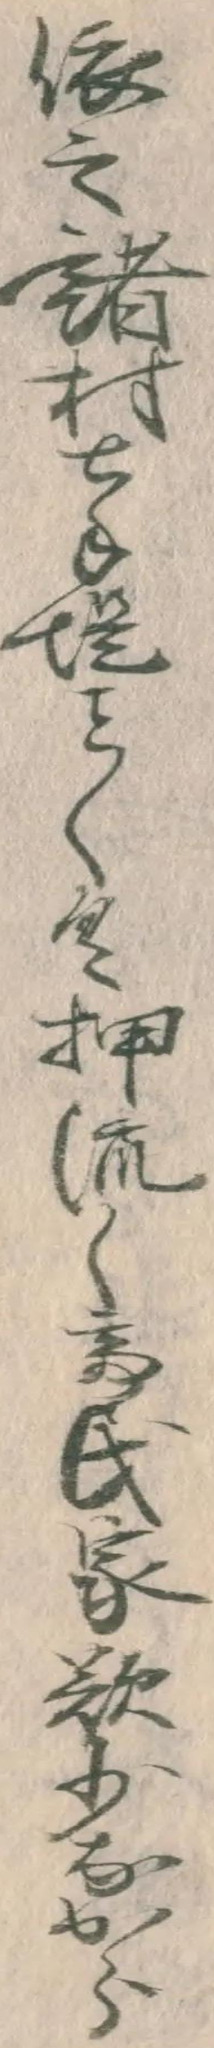依之諸村土手堤こと〳〵く押流して民家歎少なから
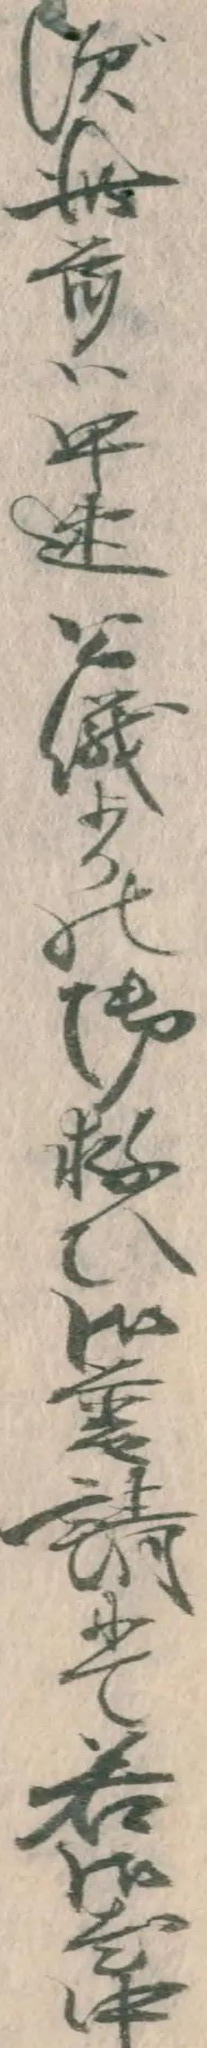ず此節ハ早速公儀よりの御救ひ御普請にて若御老中
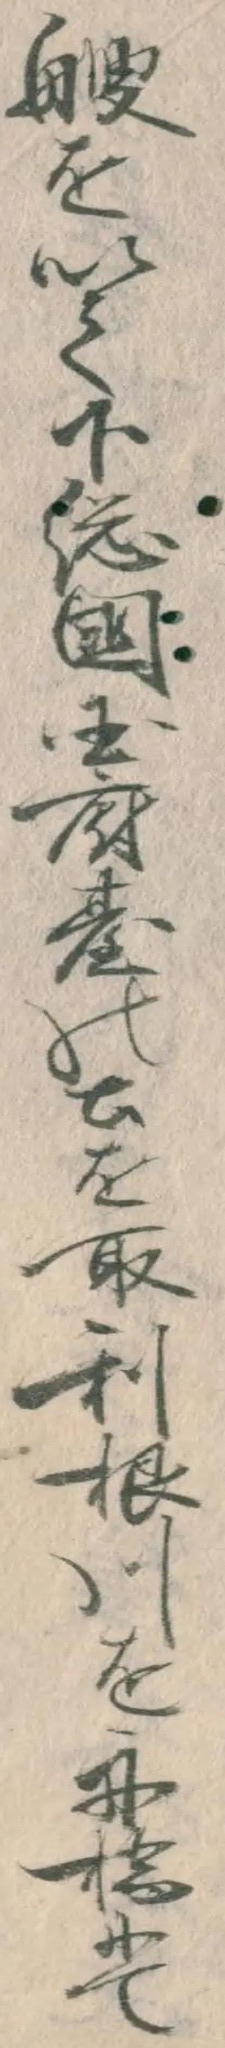艘を以て下総国府台の土を取利根川を舟橋にて
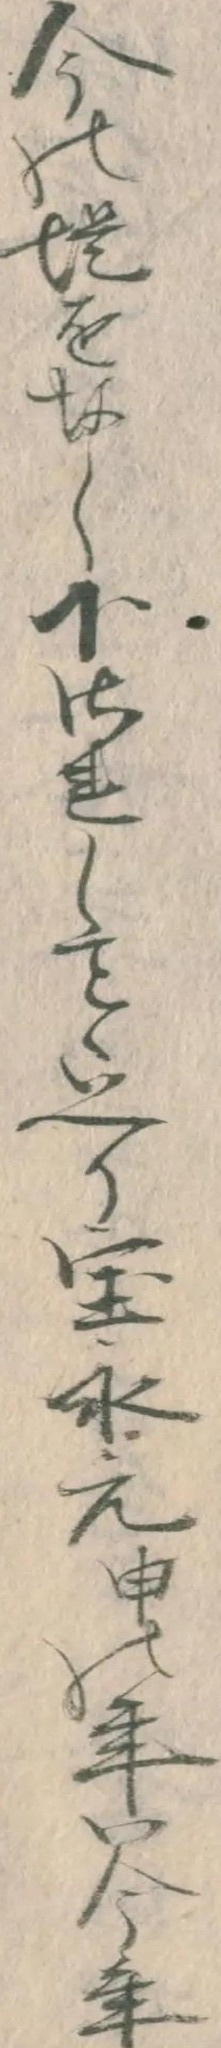今の堤をなし下されしことゝいへり宝永元申の年は今年

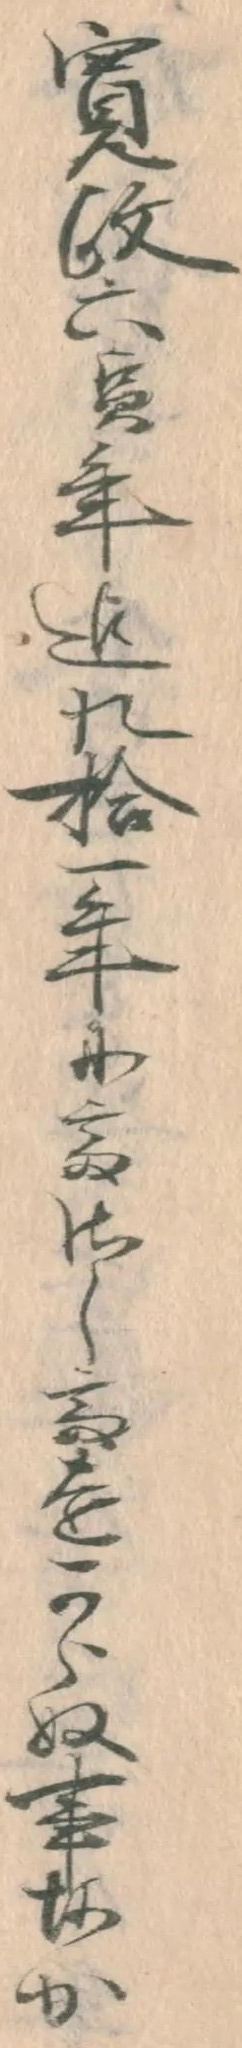寛政六寅年迄九拾一年にてさして遠からぬ事なか
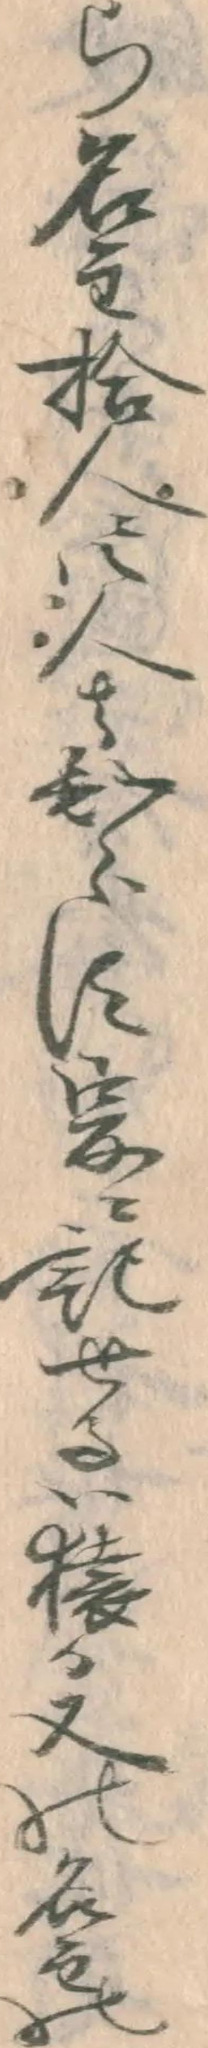ら名主拾人に八人は知らす爰に記せるは猿か又の名主の
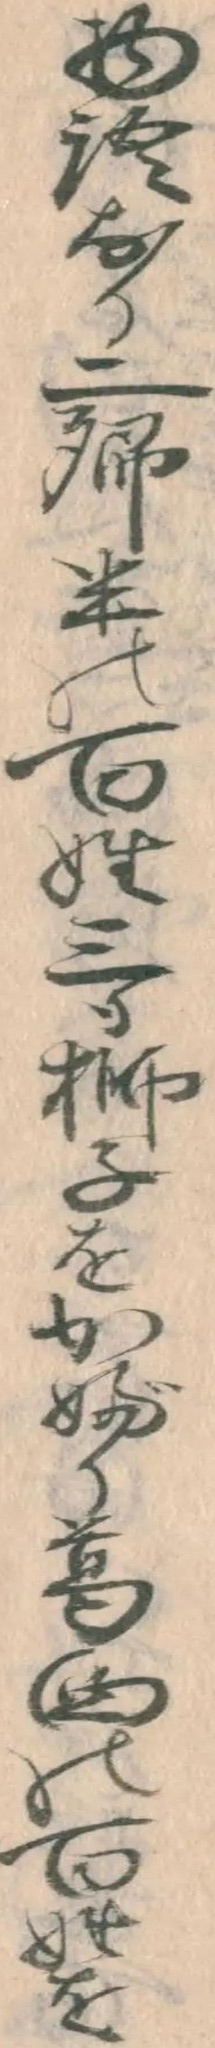物語なり二郷半の百姓三つ獅子をかぶり葛西の百姓を
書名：四神地名録 6巻. [4]葛飾郡
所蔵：国立国会図書館 National Diet Library, JAPAN
